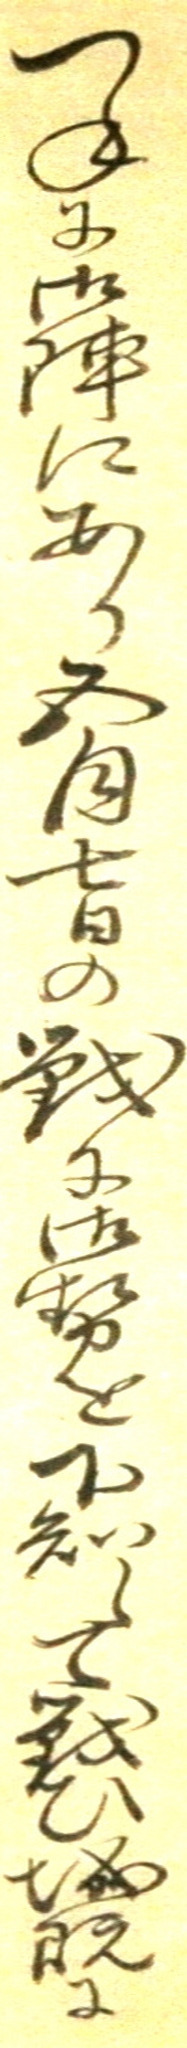つねに御陣にあり五月七日の戦に御勢を下知して戦ひ城既に
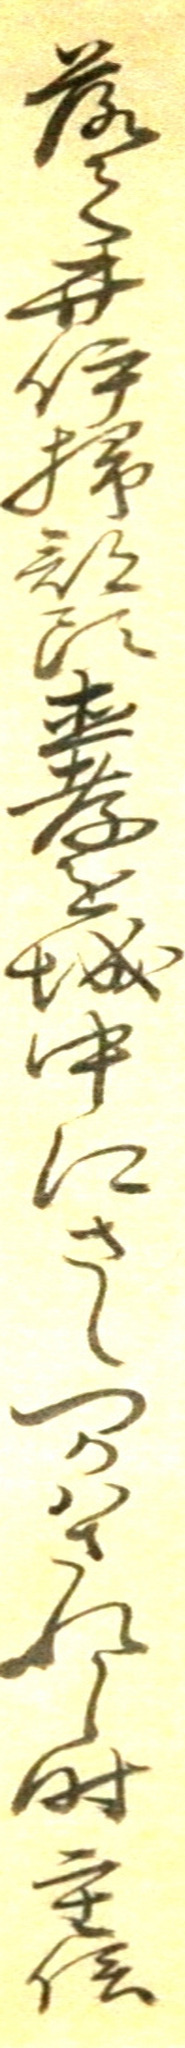落て井伊掃部頭直孝を城中にさしつかはされし時重信
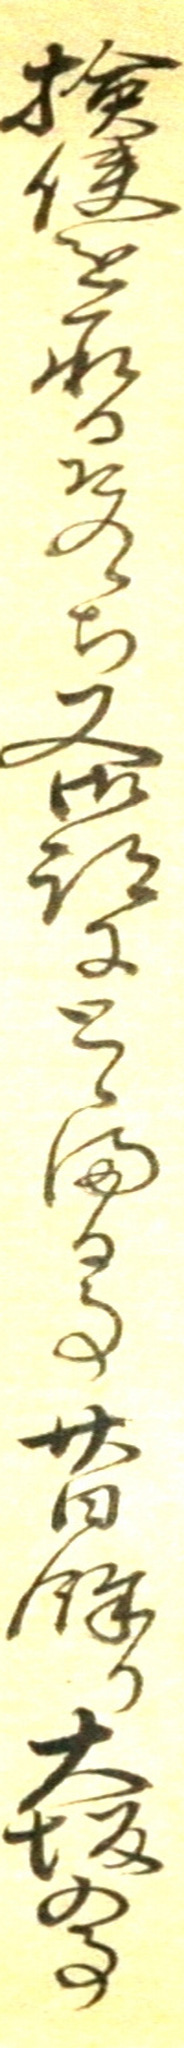撿使を承るそのゝち又御跡にとゝまる事廿日余り大坂の事
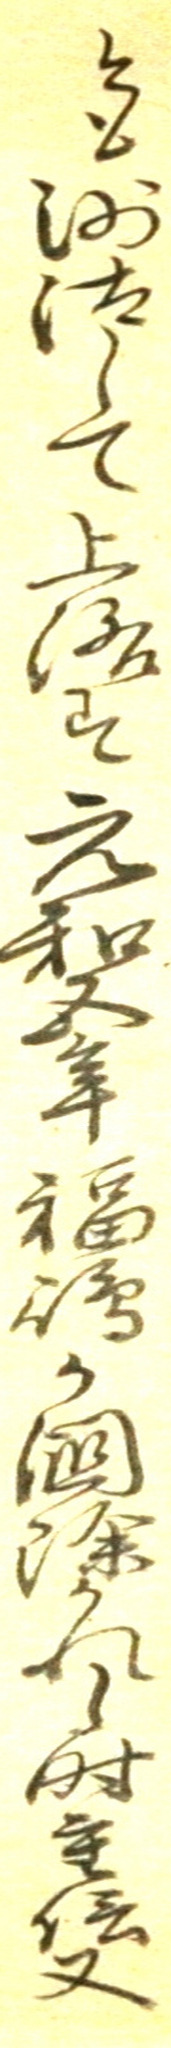とも沙汰して上洛す元和五年福島か国除かれし時重信又
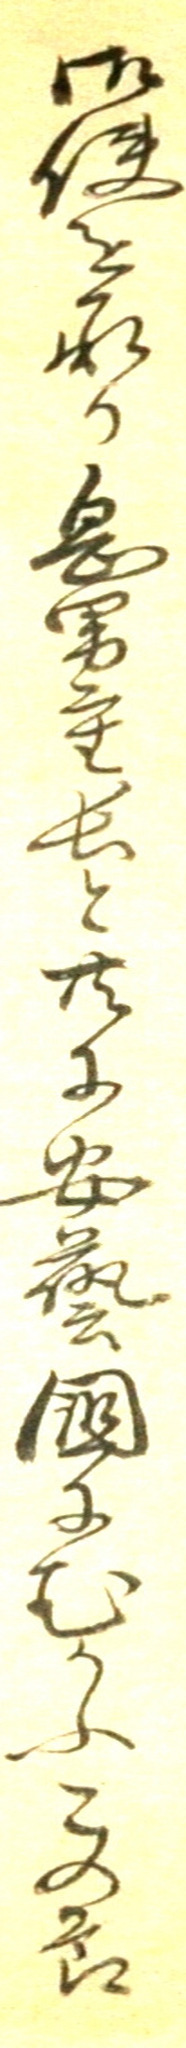御使を承り息男重長と共に安芸国にむかふこの節
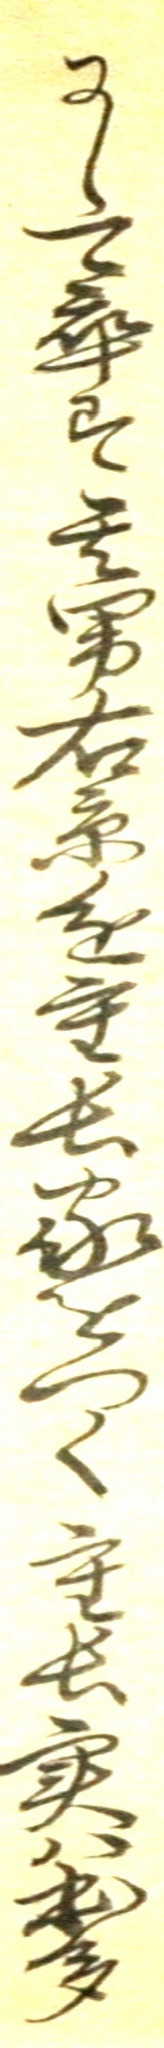にして卒す其男右京進重長家をつく重長実は本多
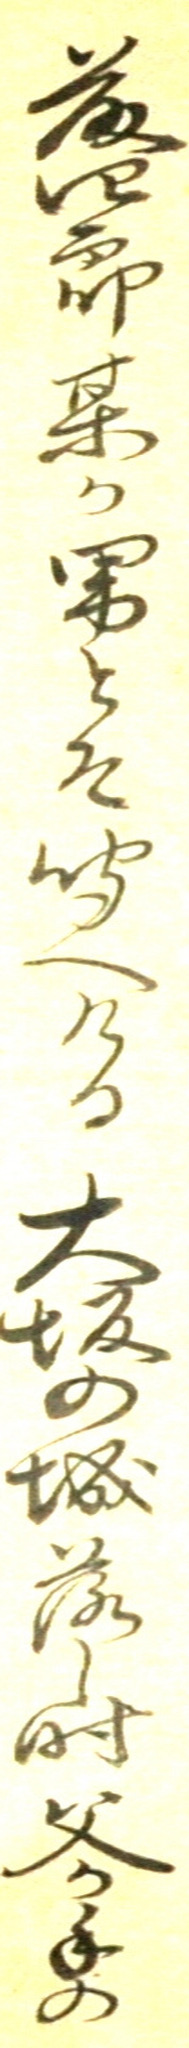藤四郎某か男とそ聞へける大坂の城落し時父か手の
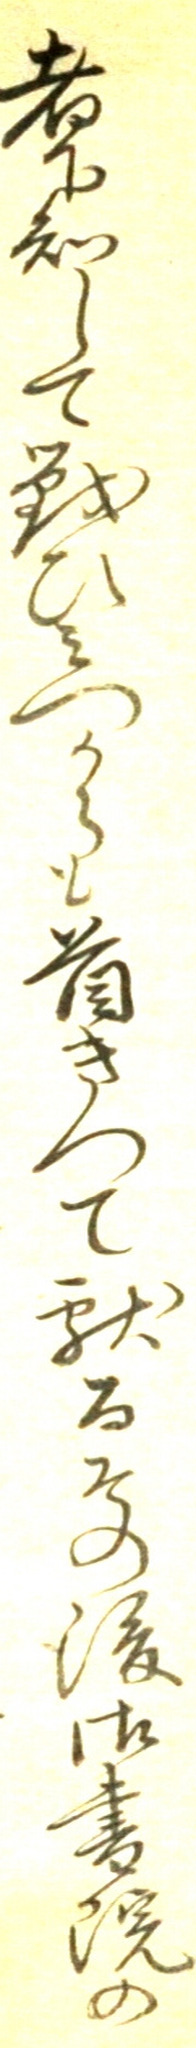者下知して戦ひみつからも首きつて献るその後御書院の
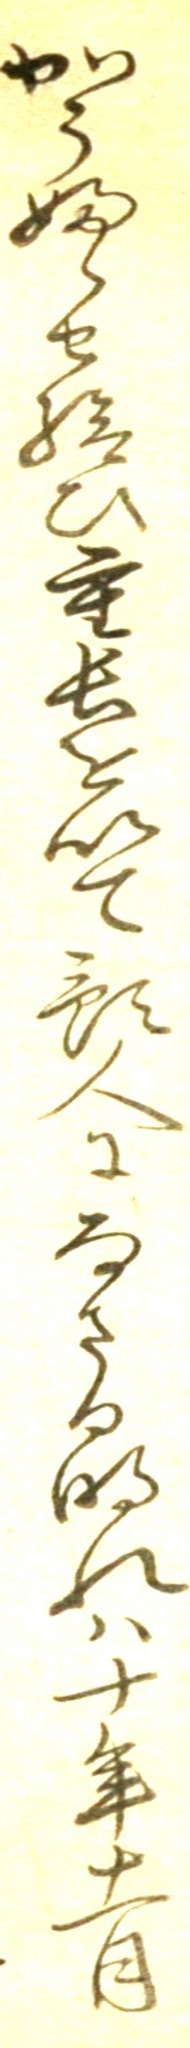かうふらせ給ひ重長を以て預人になさる明れは十年十一月

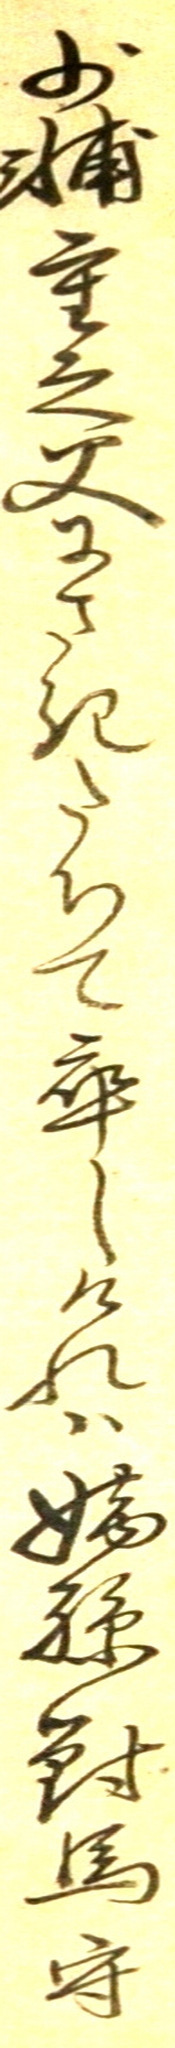少輔重之父にさきたちて卒しけれは嫡孫対馬守
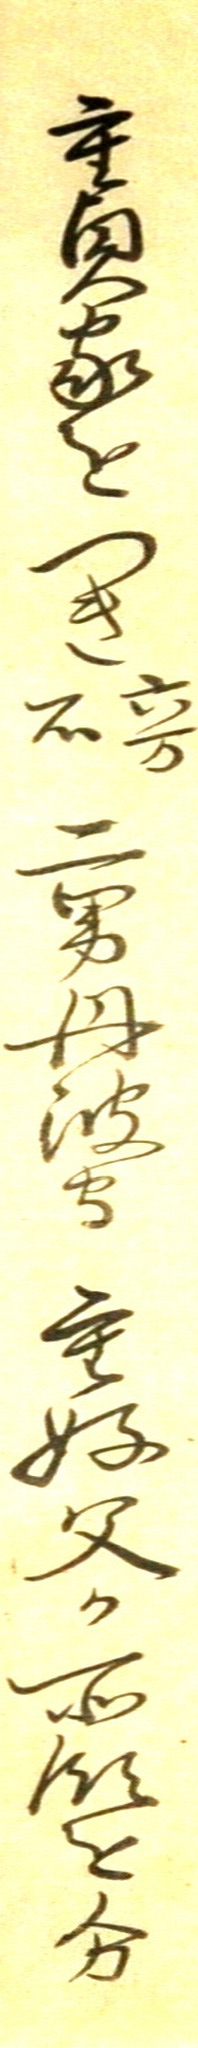重貞家をつき六万石二男丹波守重好父か所領を分
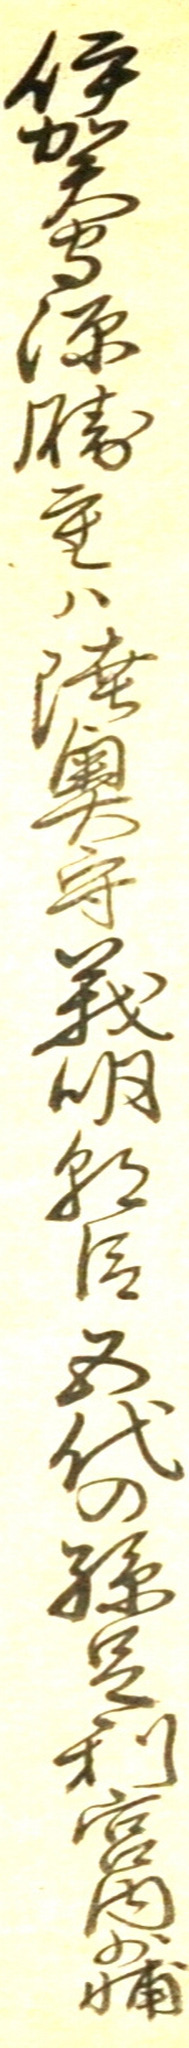伊賀守源勝重は陸奥守義明朝臣五代の孫足利宮内少輔
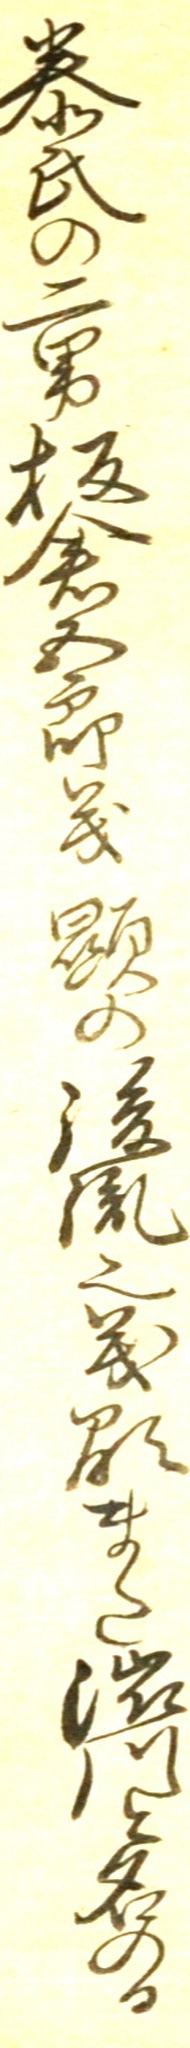泰氏の二男板倉五郎義顕の後胤也義顕また渋川と名のる
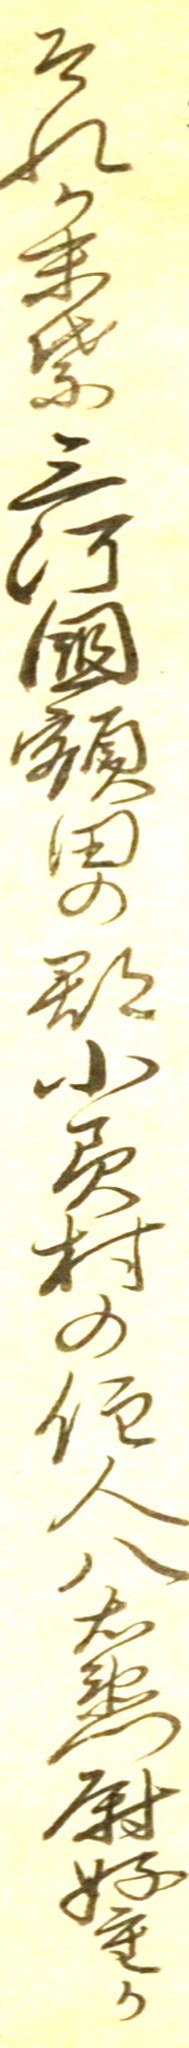それか末葉三河国額田の郡小美村の住人八右衛門尉好重か
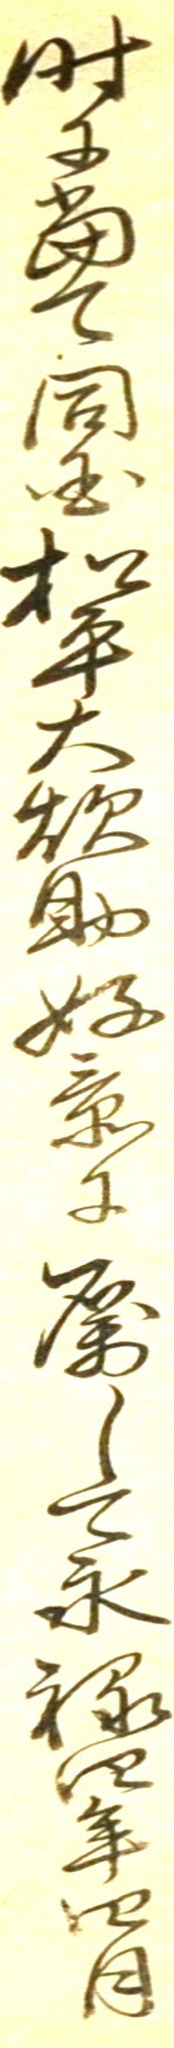時に当て同国松平大炊助好景に属して永禄四年四月
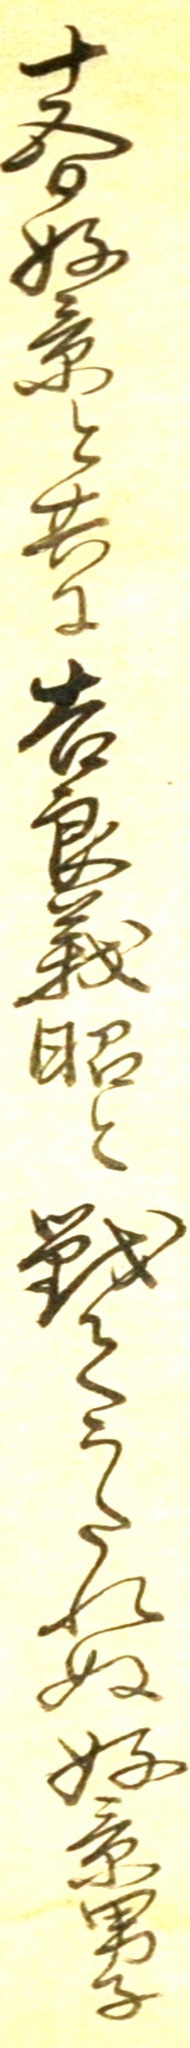十五日好景と共に吉良義昭と戦てうたれぬ好景男子
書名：藩翰譜（五）
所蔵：伊那市立高遠町図書館・合同会社AMANE
